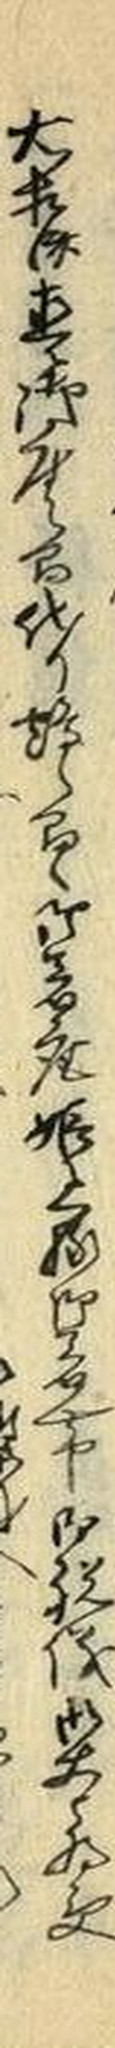右相済直々御座之間代り鶴之間へ御着座姫君様御着帯御祝儀御使被為受
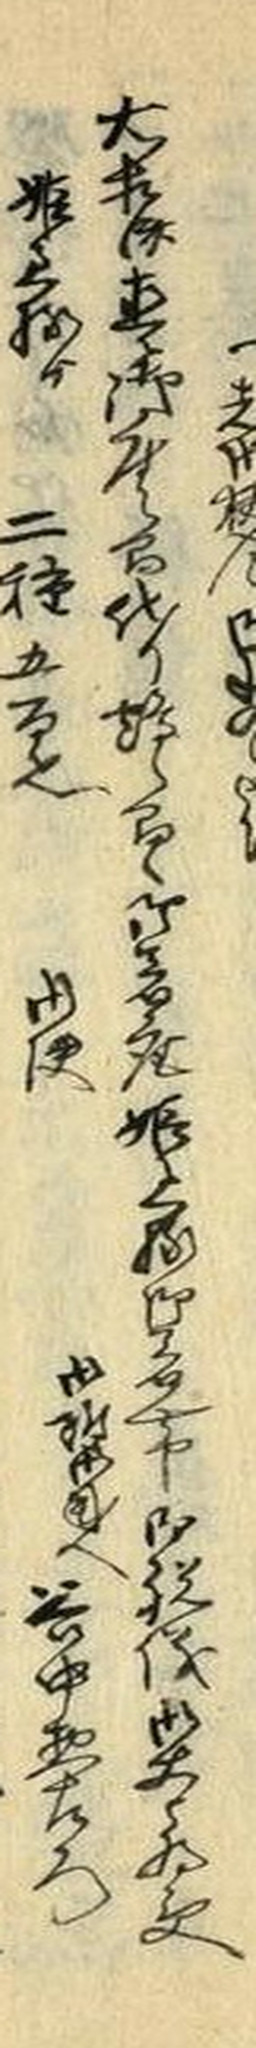姫君様ゟ二種五百疋御使御附御用人谷中惣左衛門
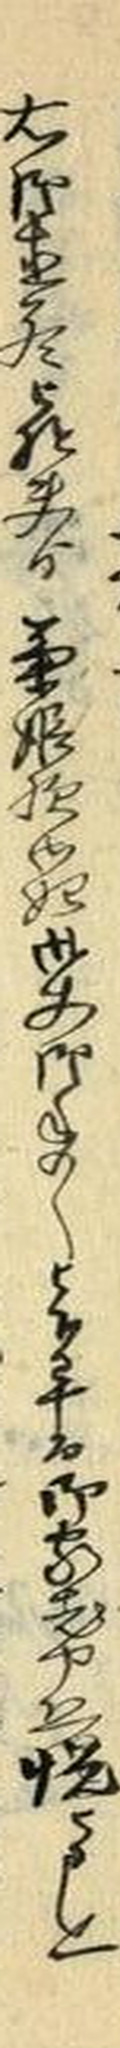右御直答被遊夫ゟ菊姫様御始御使御手のし被下畢而御家老中恐悦被申上
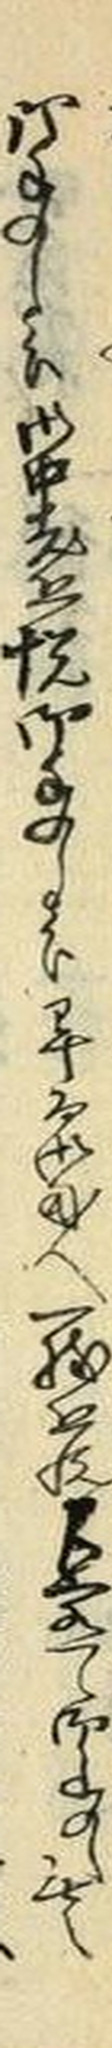御手のし被下御中老恐悦御手のし被下畢而御用人一統恐悦申上有御手のし無之
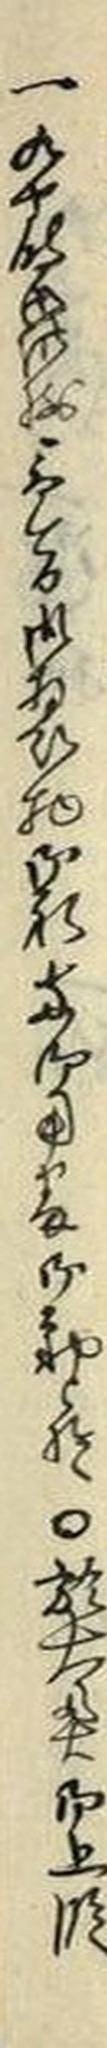一九半時御供揃ニ而今日御拝領物御礼両御用番御勤被遊候○於大奥御上段
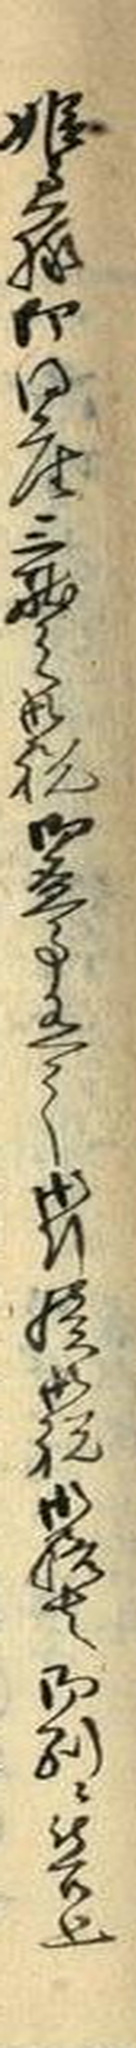姫君様御同座三献之御祝御盃事有之御引続御祝御膳は御別々被召上
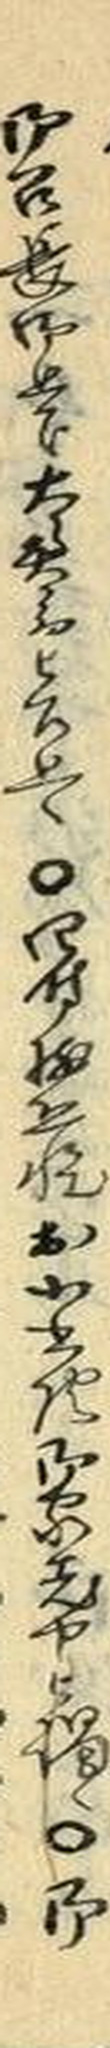御召長御上下大奥ニ而被召上候○四時揃恐悦於小書院御家老中被謁候○御
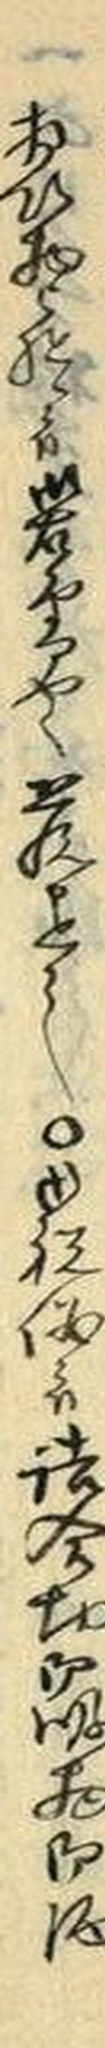拝領物被遊候ニ付御右筆部やへ恐悦申上之○御祝儀ニ付詰合切御吸物御酒
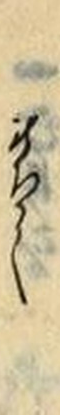被下之
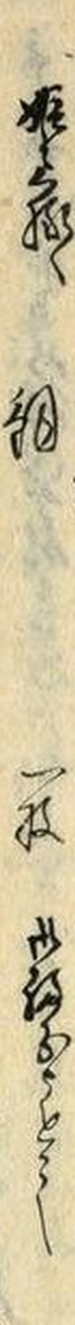姫君様へ鯛一枚御福分被進之
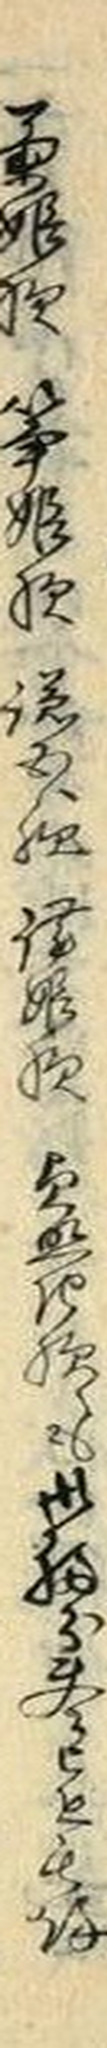菊姫様箏姫様謙五郎様謹姫様貞照院様へも御福分夫々被進其餘
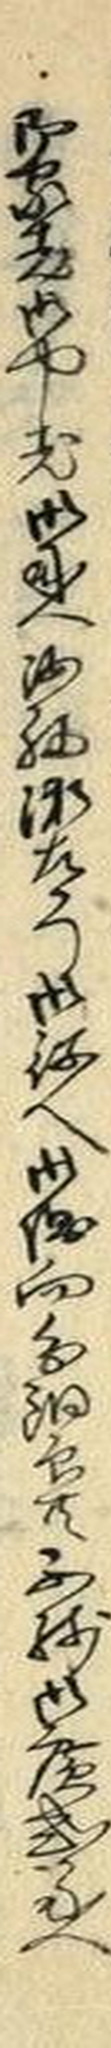御家老御中老御用人海福瀬左衛門御役人御側向分銅印共不残御広式御用人
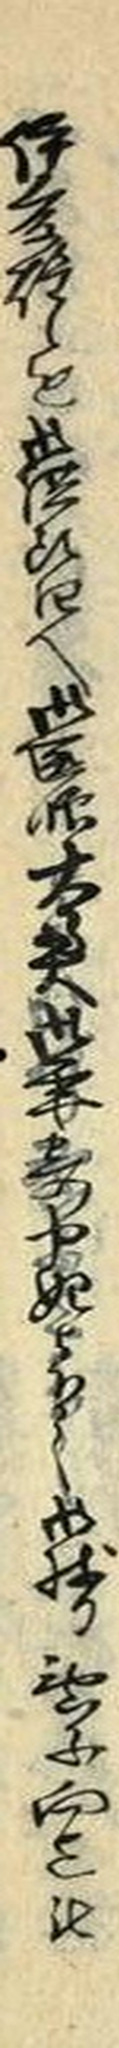伊藤雄之進御供頭四人御医師大奥御年寄中始被下之御残り台子向迄被
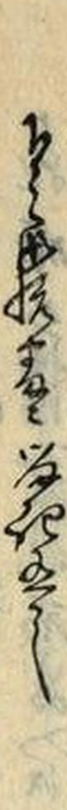下之御膳番ニ留記有之
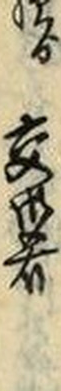交御肴一台
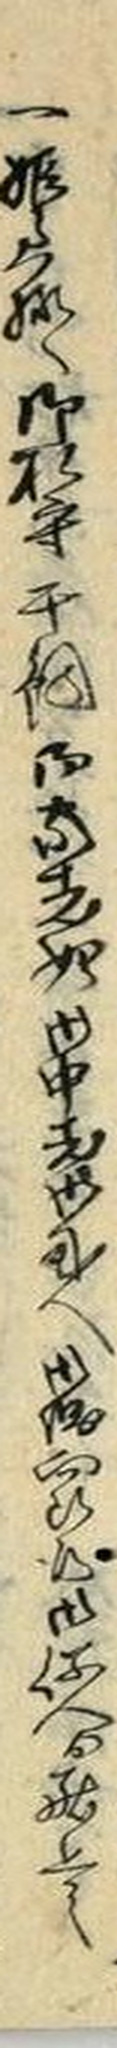一姫君様へ御札守干鯛御家老始御中老御用人御側向頭取御役人ゟ献上之
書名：少傅日録抄（斉承付側向頭取日記、在府）
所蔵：福井県文書館 Fukui Prefectural Archives
